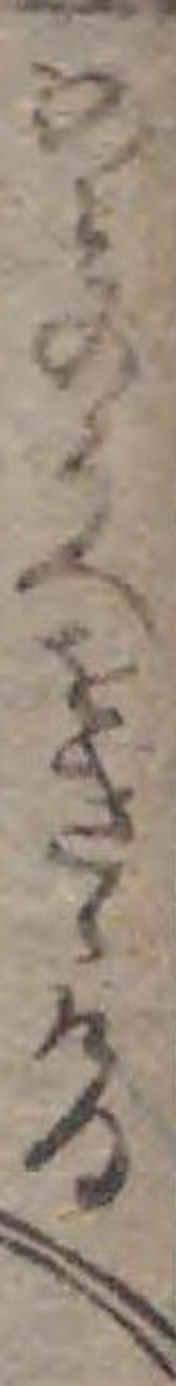のみのうへをきゝける
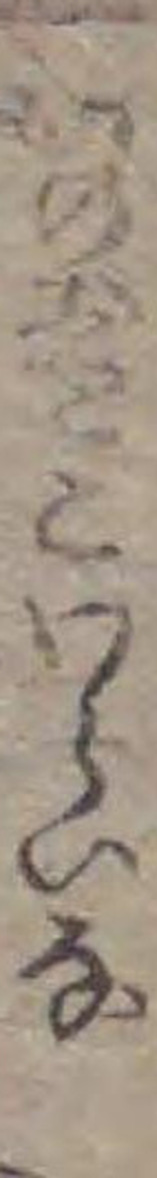かのおとこわらいな
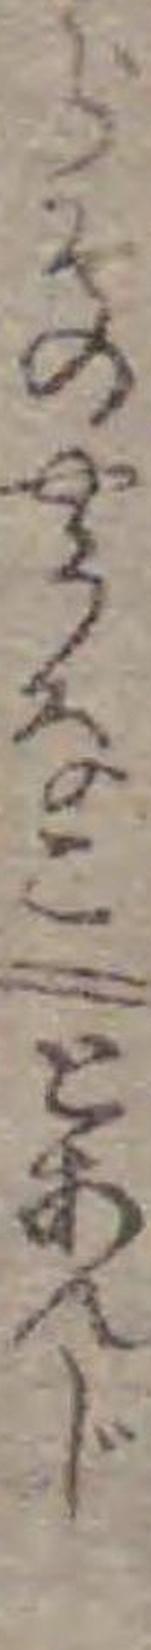がらそのやうなことあんじ
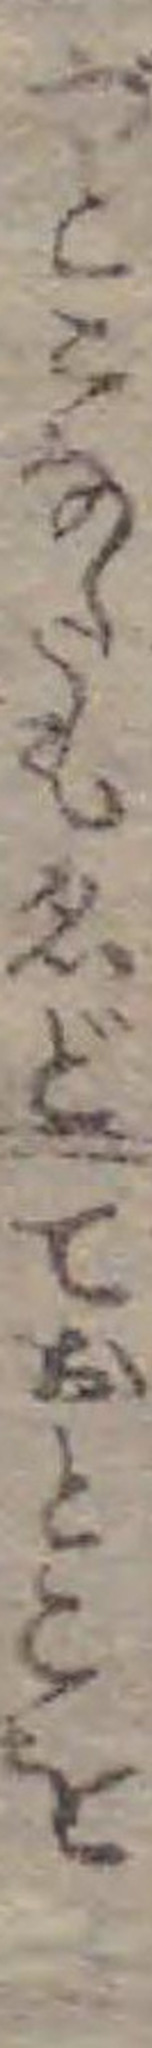づとこなたもゑどておとこを
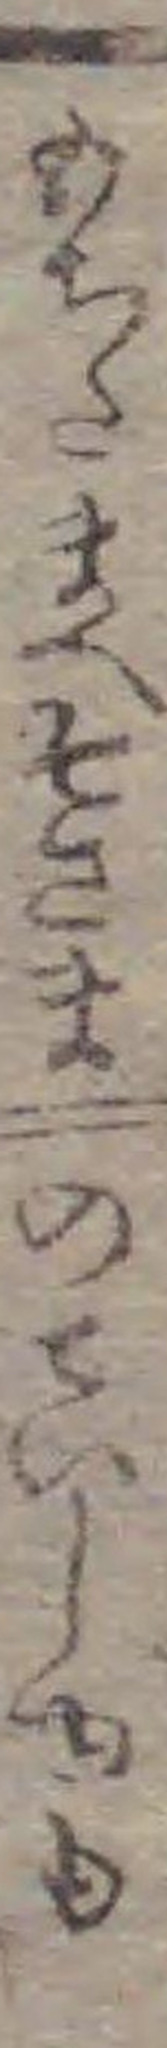もちたまへそさまのていしゆも
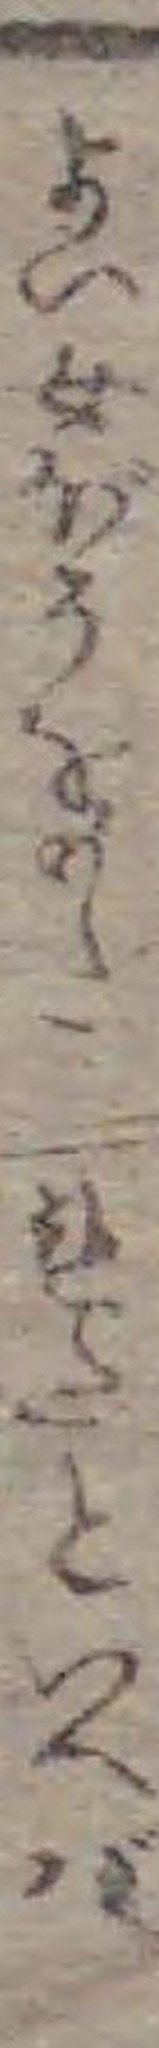よい女ぼうをもたれたといへば
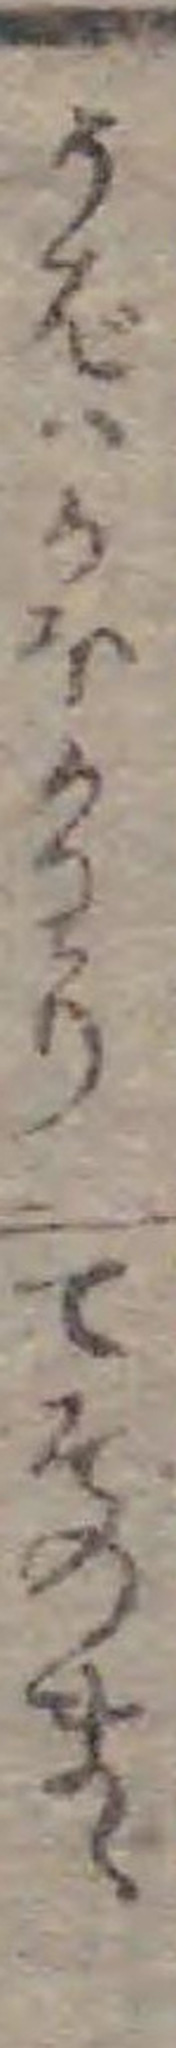うばはかほかわりてそのまゝ
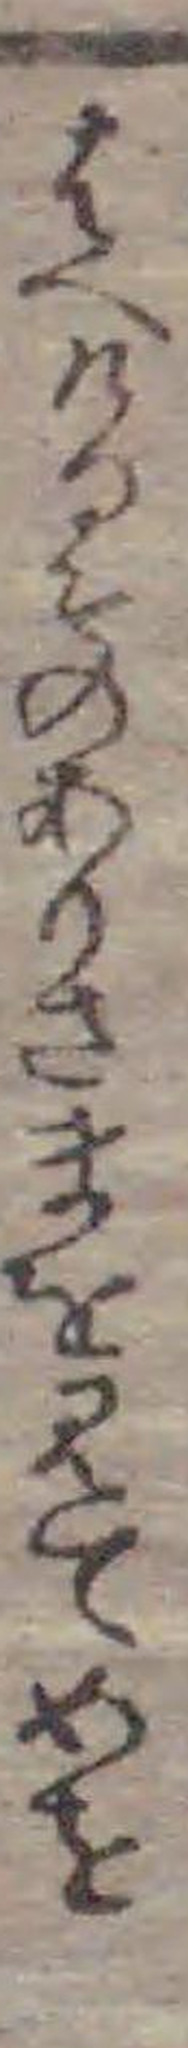はへけるそのありさまを見てめを
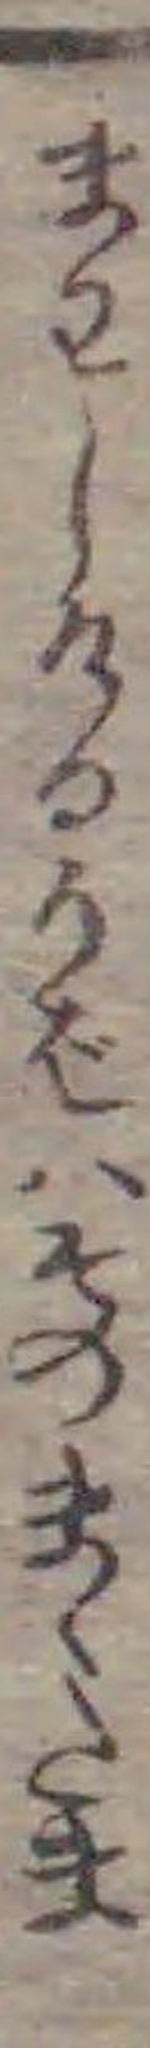まわしけるうばはそのまゝたま
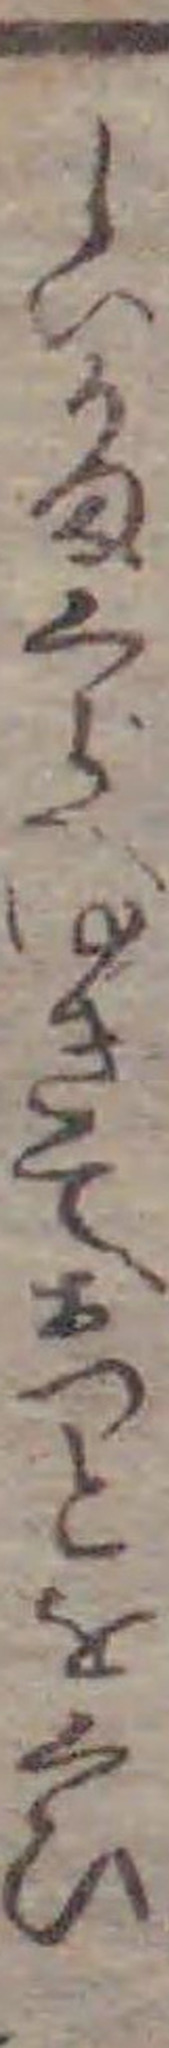しいかまくらへゆきておつとをくひ
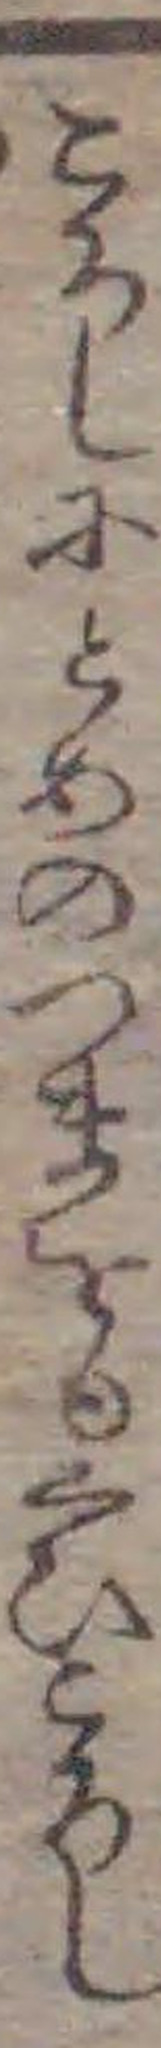ころしにとめのつまをもくひころし
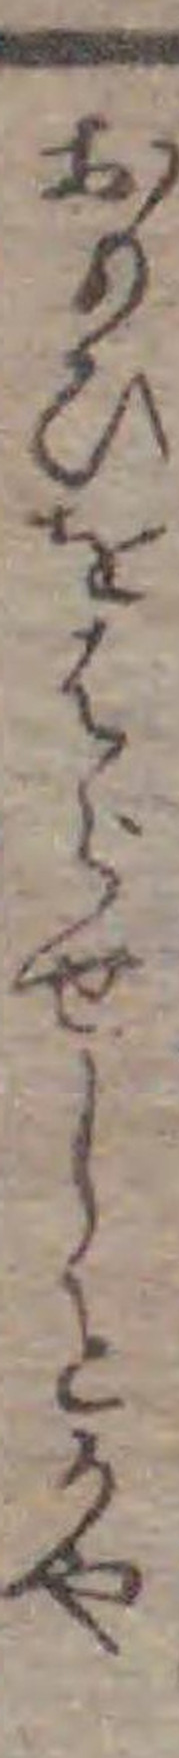おもひをはらせしとかや

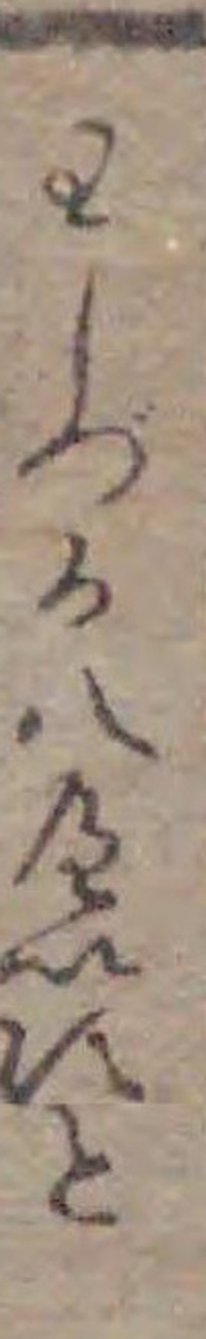わしづか八べい次と
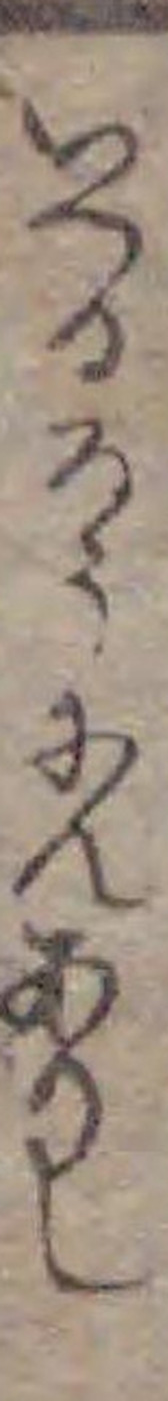いへるろうにんありし
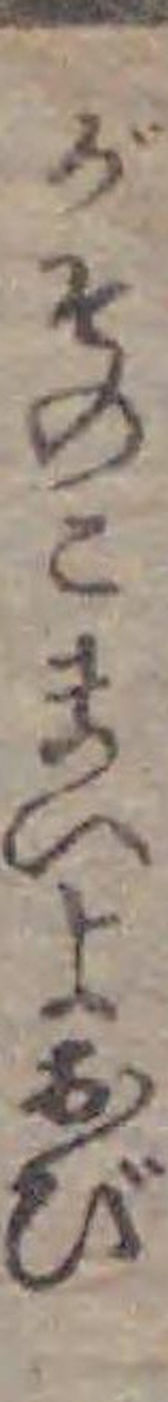がそのこまいよおび
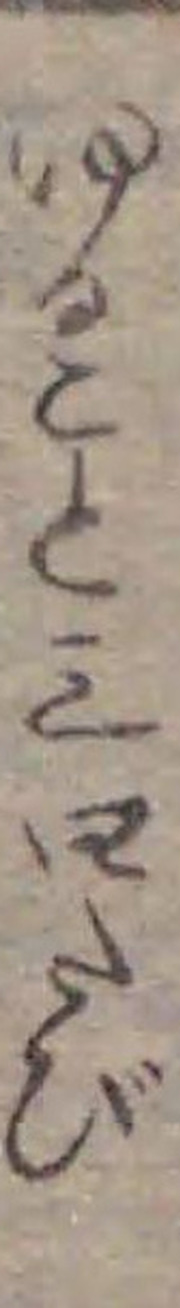ゆること三四たび
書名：変化物春遊 : 2巻
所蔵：国立国会図書館 National Diet Library, JAPAN
